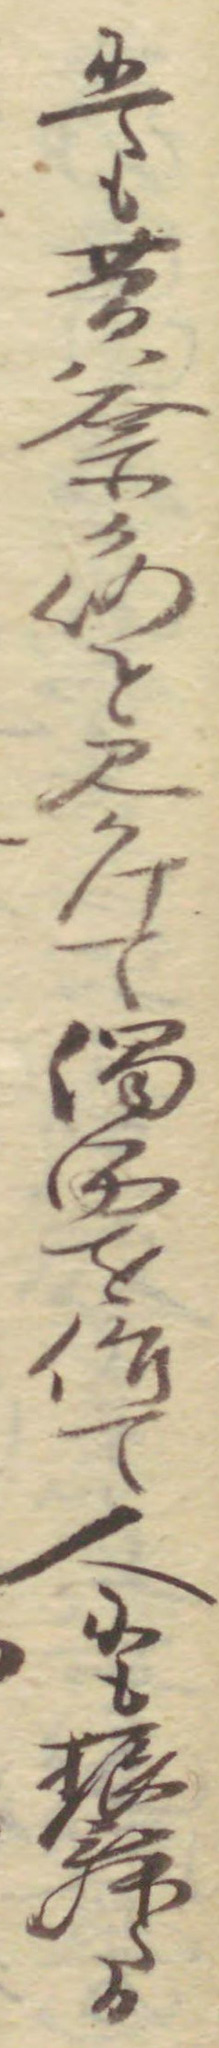にても昔は祭か何そ見かけて濁酒を作て人にも振舞たる
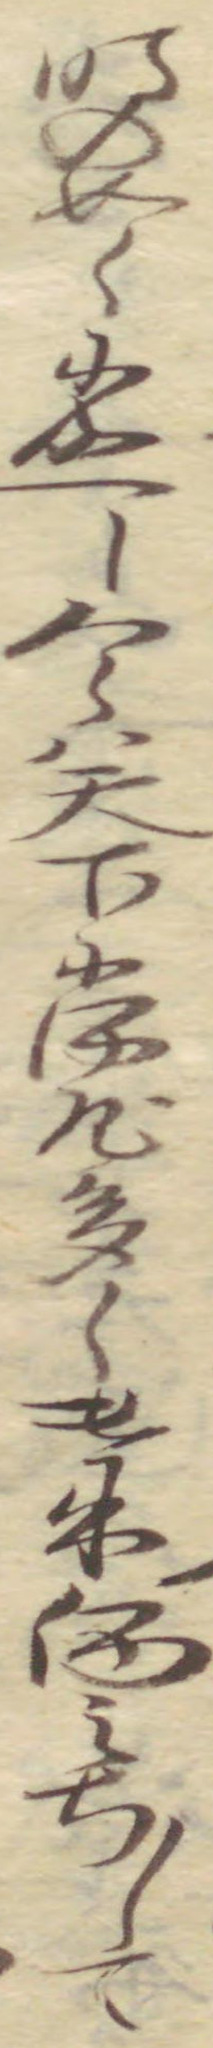時の如くに成へし今は天下に酒屋多く出来酒みち〳〵て
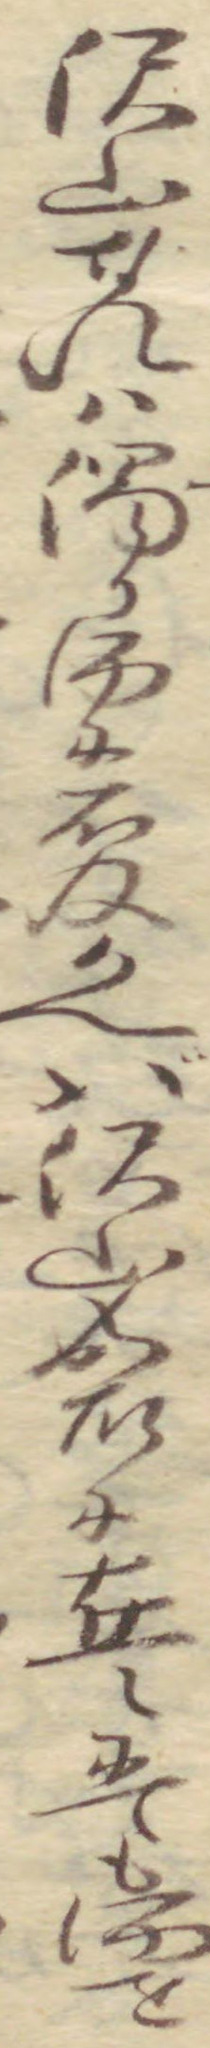沢山なれは濁り酒に不及かへば沢山成故に在〻にても酒を
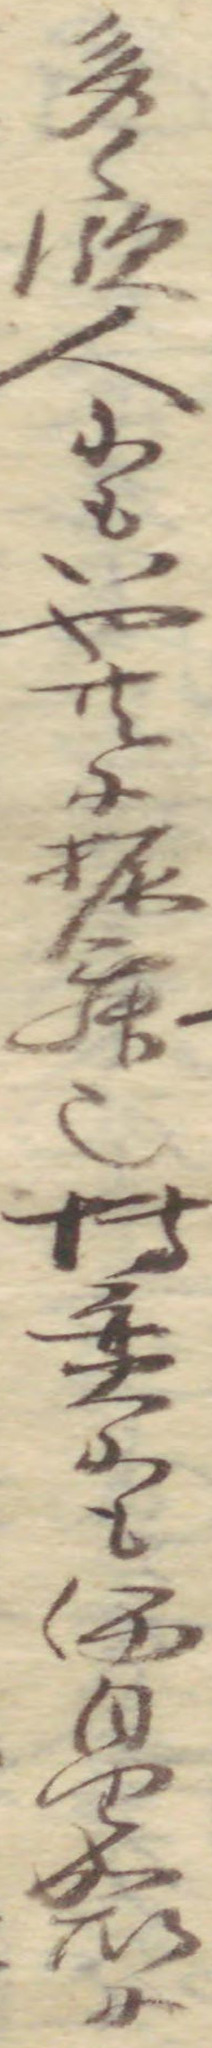多く飲人にもいや共に振舞也博奕にも酒自由成故に
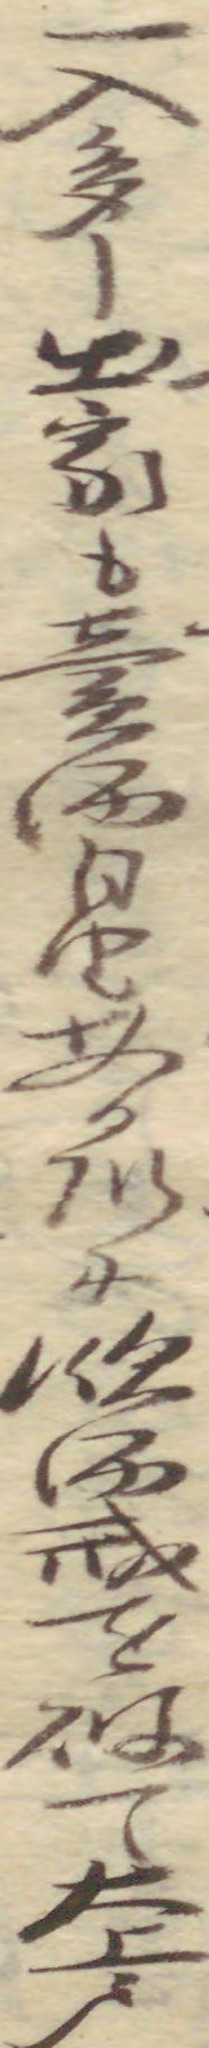一入多し出家も売酒自由なる故に飲酒戒を破て大上戸
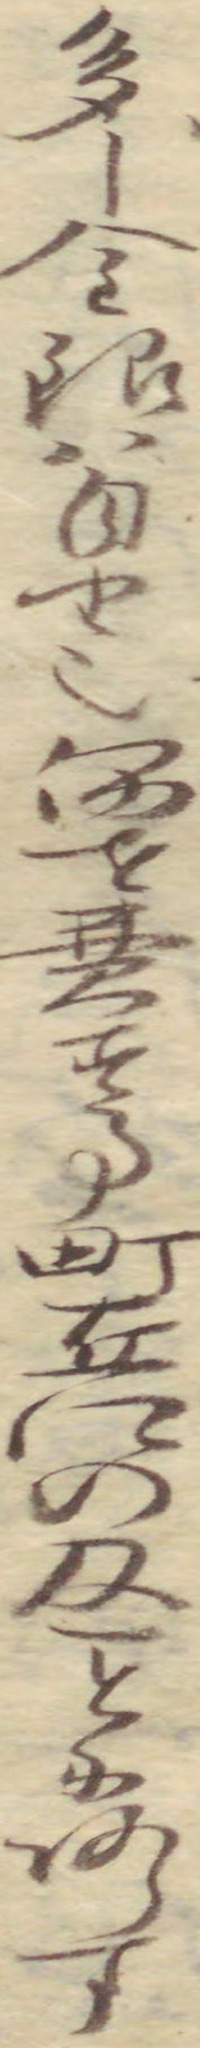多し金銀は自由也酒を費す事町在郷の及ことにあらす
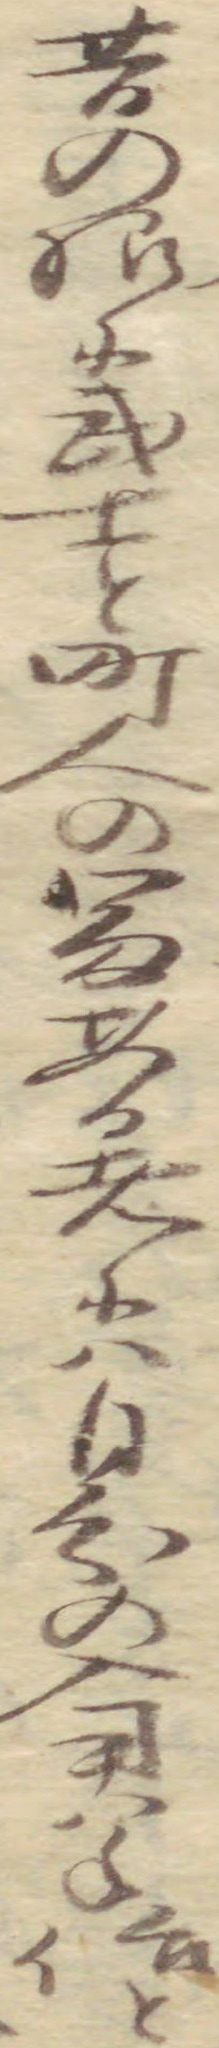昔の様に武士と町人の富なる者には自分の入用は手作と
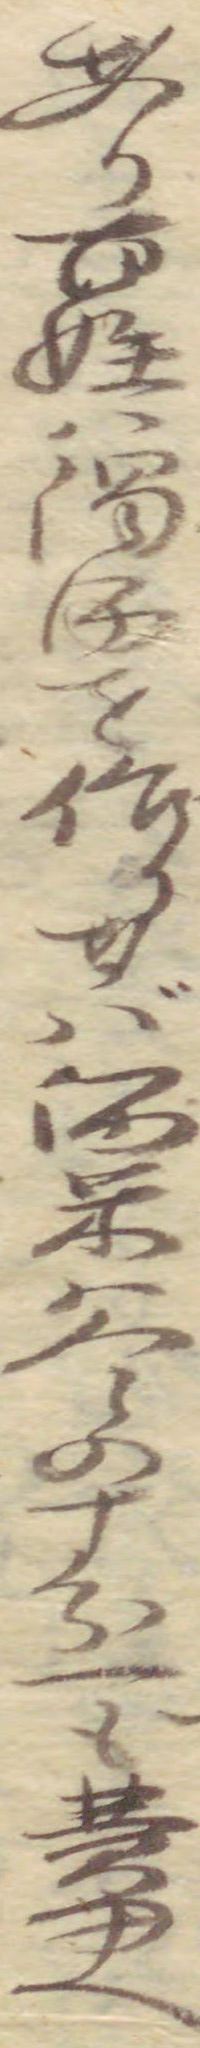なり百姓は濁酒を作りなば酒米は今の十分一も費ゆへ
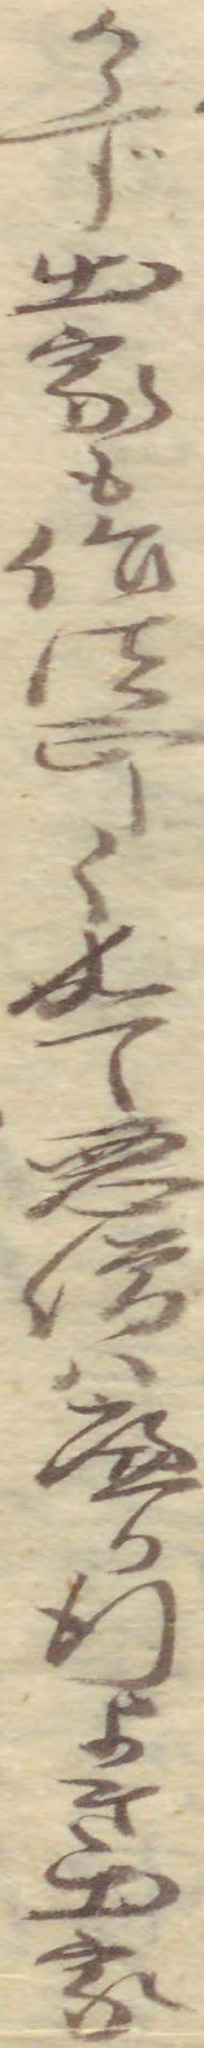からず出家も作法正しく成て悪僧はへり行よき出家
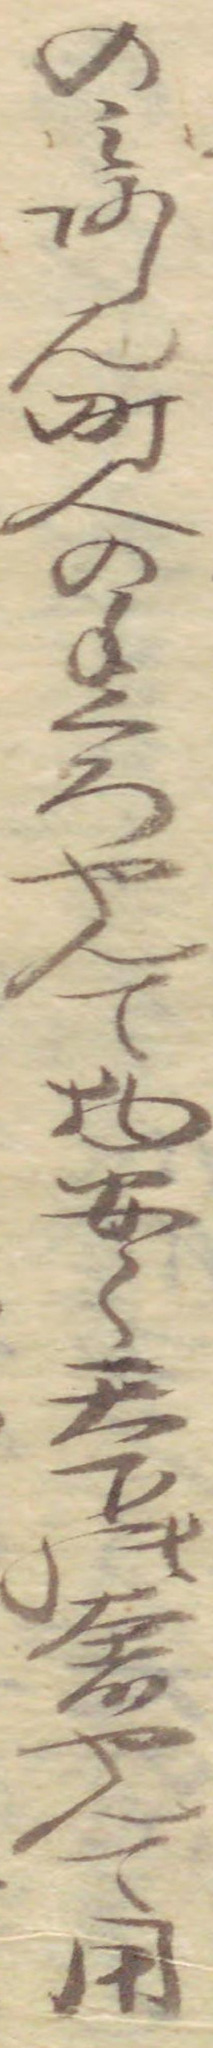のみあらん町人の手くろやんて物安く天下の奢やんて用
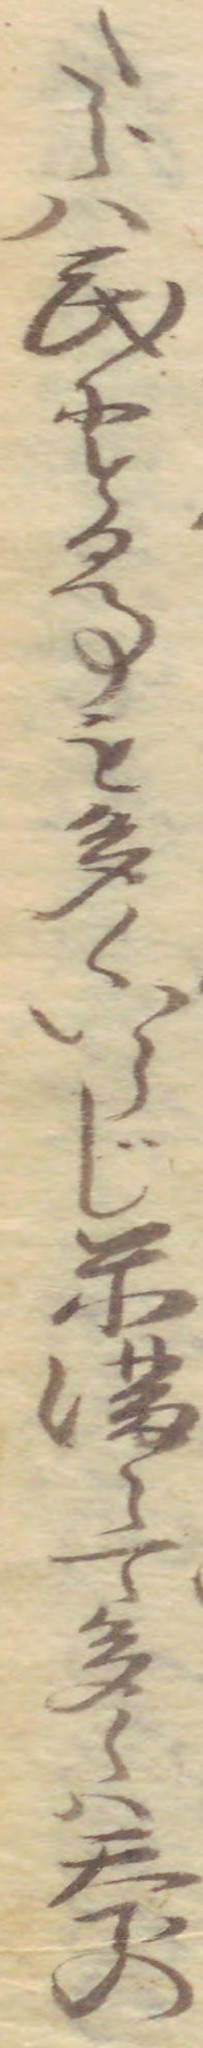たらは民にとる事も多くいらじ米満〻て多くは天下の

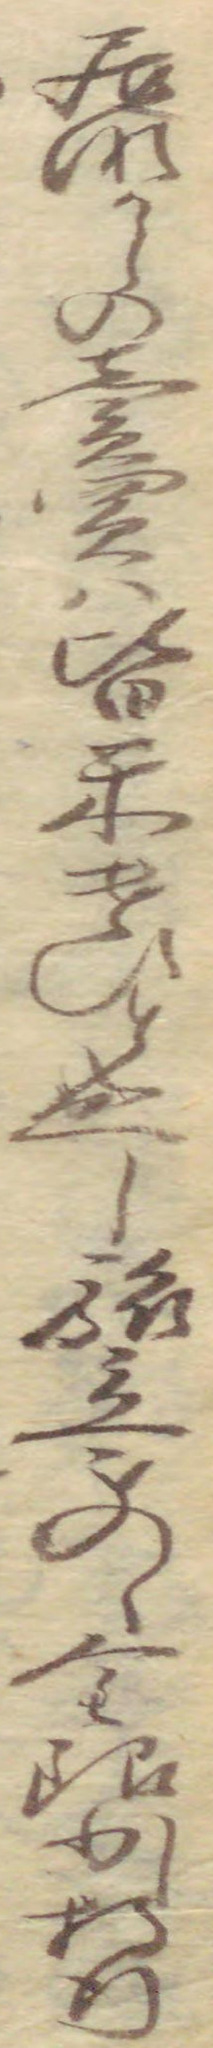居なからの売買は皆米遣ひと成へし旅立ものゝ金銀少し持行
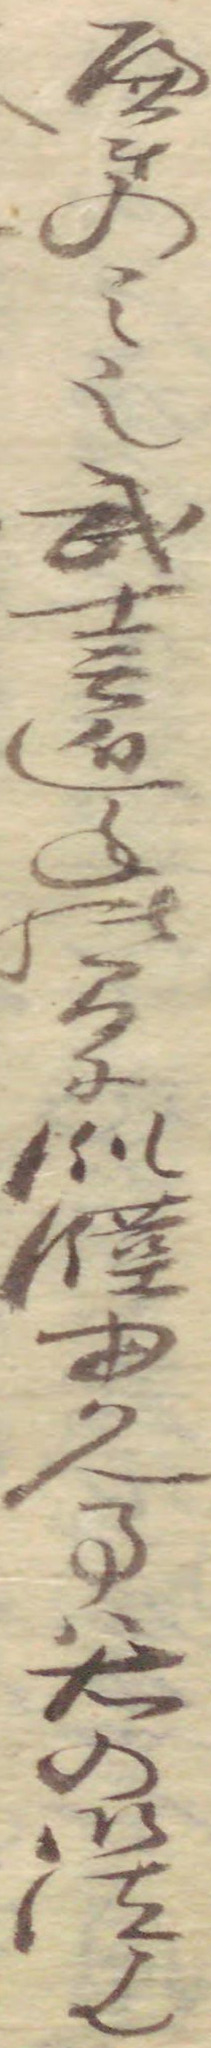へきのみ也武士云近年の間に飢饉ゆかん事は右の御法ニて
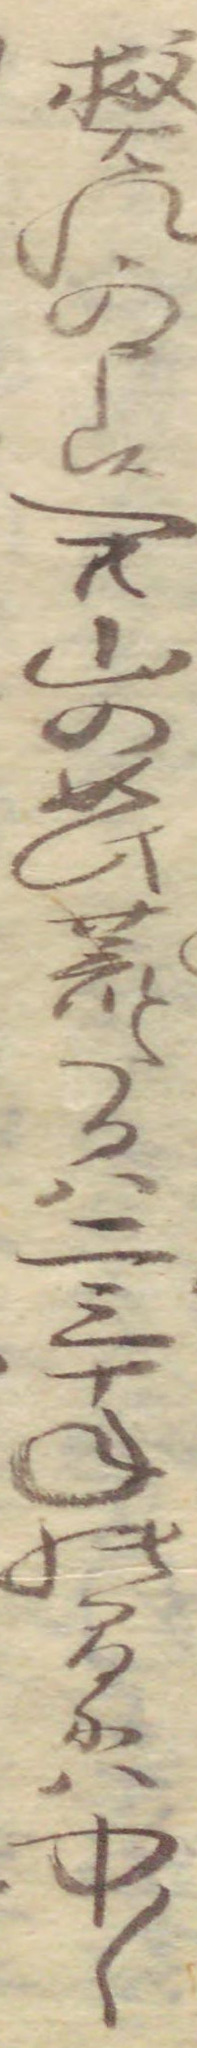救はれ可申候へ共山の如此荒たるはニ三十年の間には中〳〵
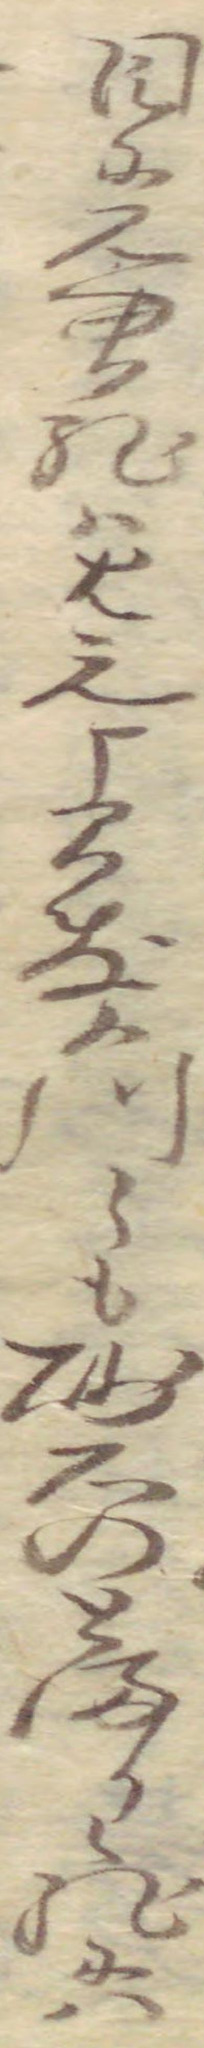目に見ゆる程はえ申間敷候川〻も砂石のとまり候程には
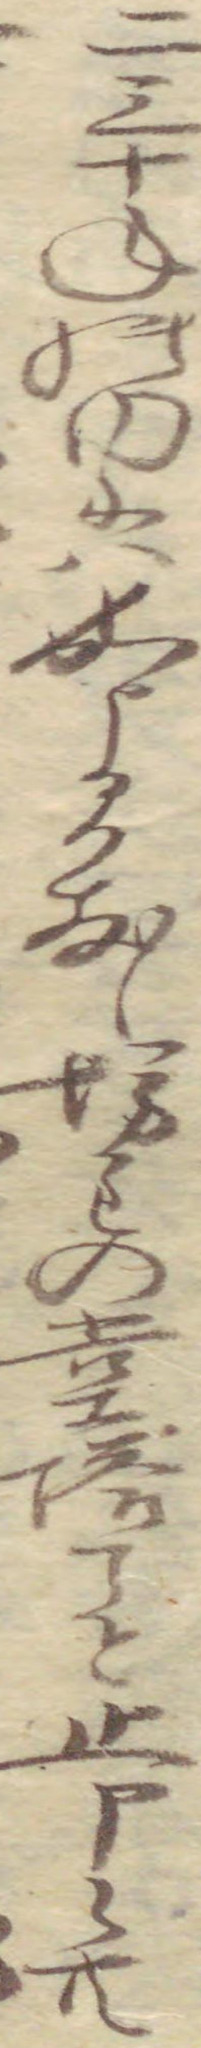二三十年の内には成申間敷候坊主の堂塔こそ止申候共
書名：鶯宿雑記. 巻263-264
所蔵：国立国会図書館 National Diet Library, JAPAN
